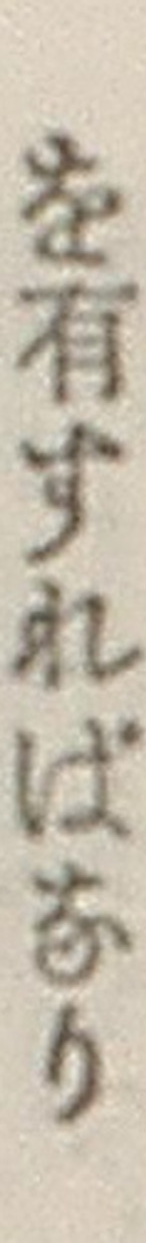を有すればなり
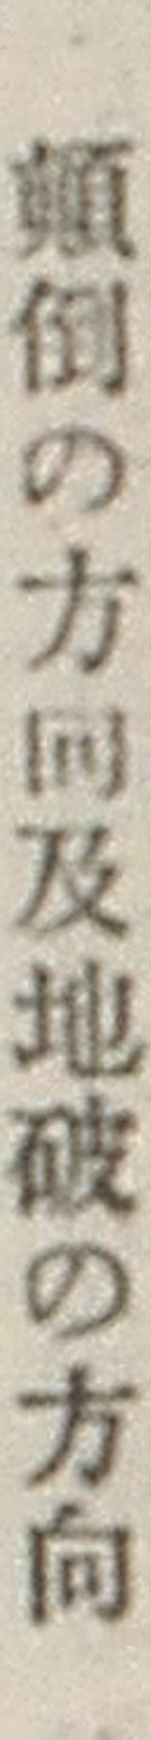顛倒の方向及地破の方向
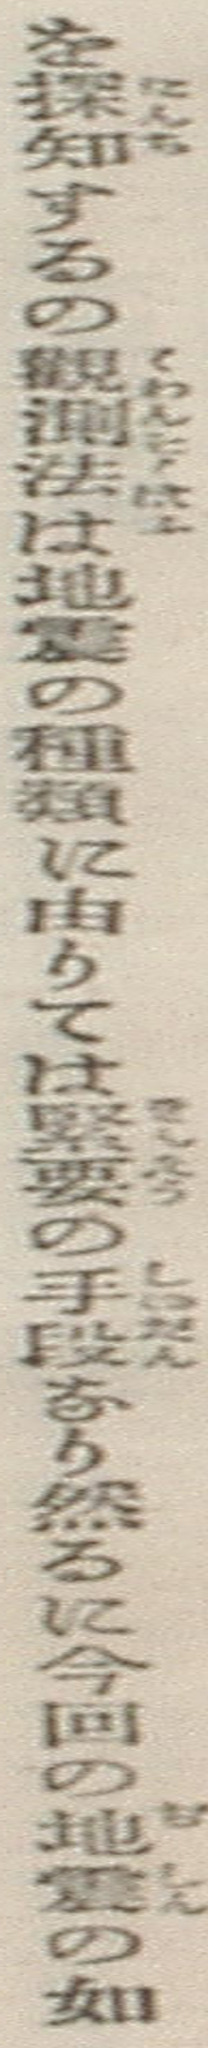を探知するの観測法は地震の種類に由りては緊要の手段なり然るに今回の地震の如
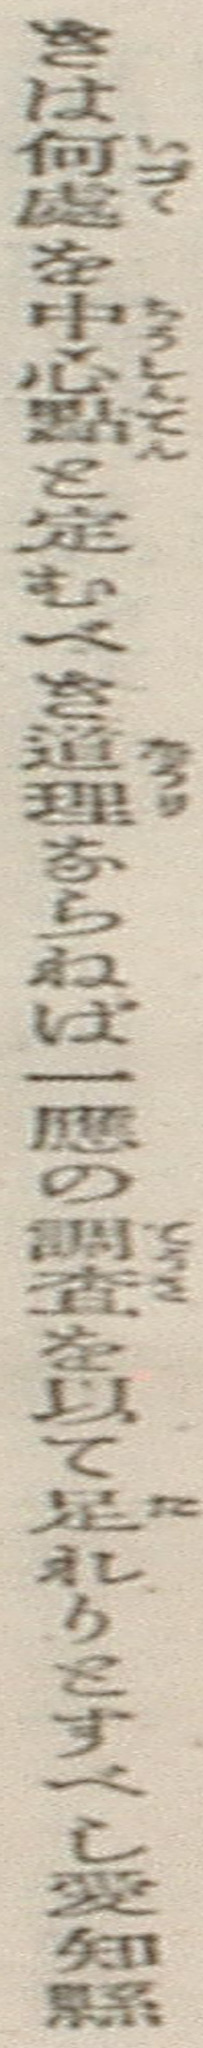きは何処を中心点と定むべき道理ならねば一応の調査を以て足れりとすべし愛知県
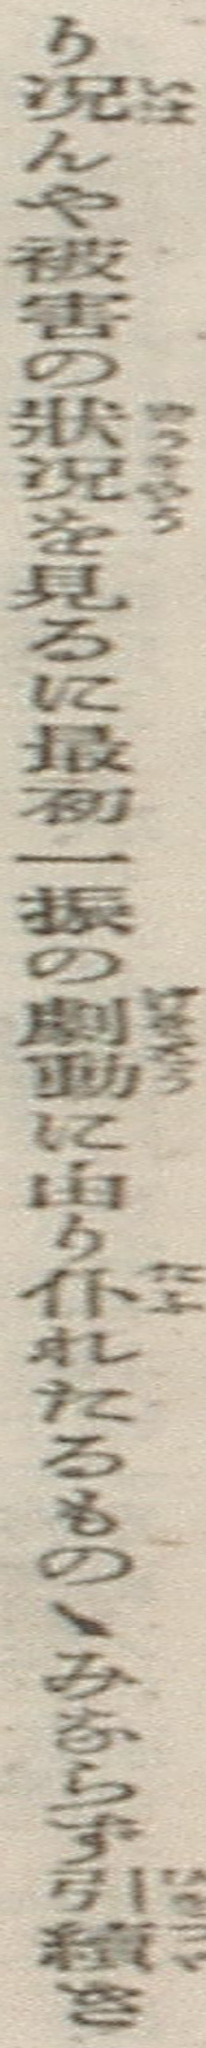り況んや被害の状況を見るに最初一振の劇動に由り仆れたるものゝみならず引続き
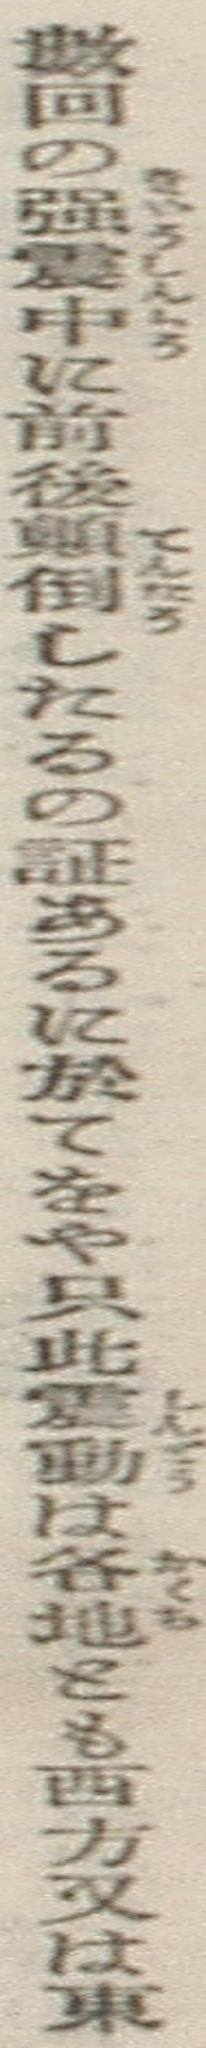数回の強震中に前後顛倒したるの証あるに於てをや只此震動は各地とも西方又は東

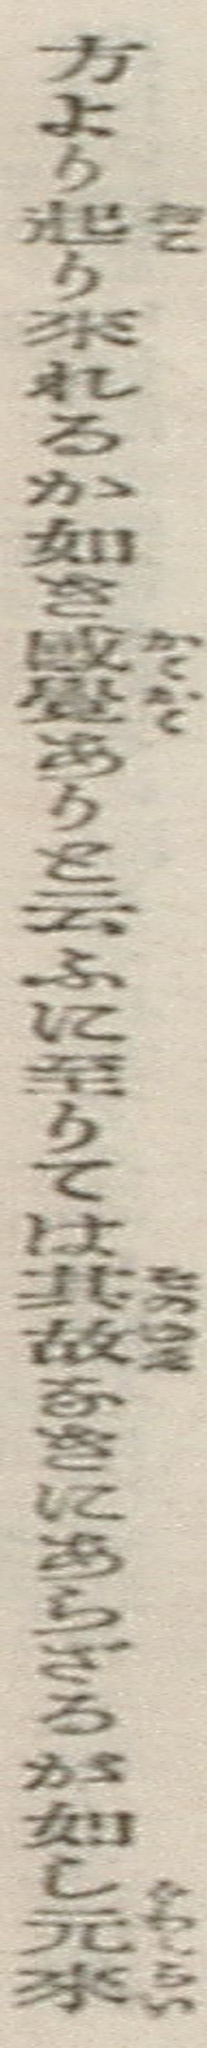方より起り来れるか如き感覚ありと云ふに至りては其故なきにあらざるが如し元来
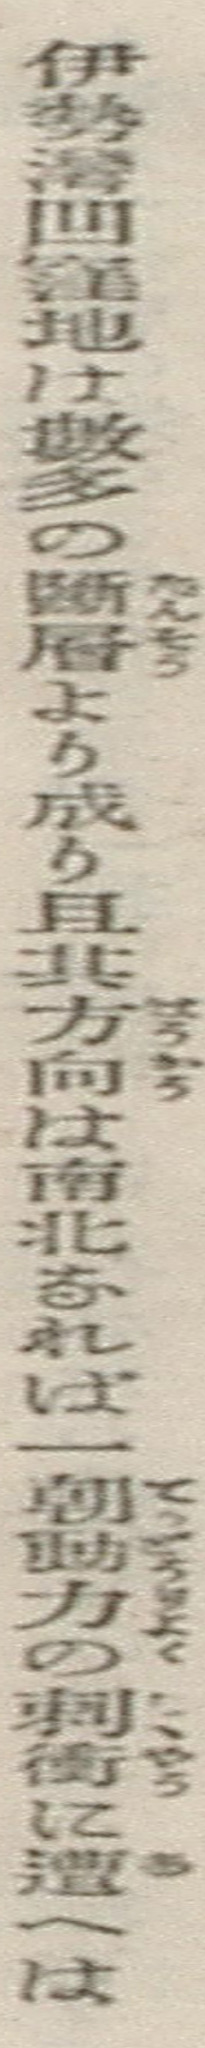伊勢湾凹窪地は数多の断層より成り且其方向は南北なれば一朝動力の刺衝に遭へは
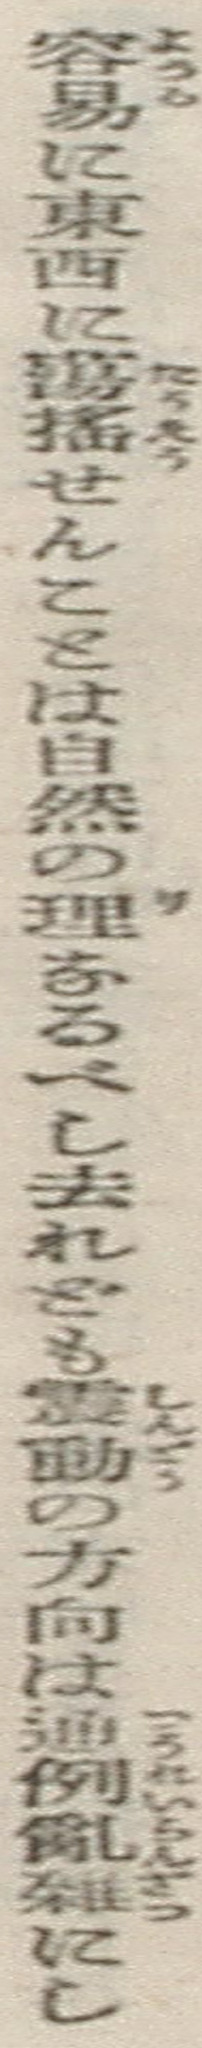容易に東西に蕩揺せんことは自然の理なるべし去れども震動の方向は通例乱雑にし
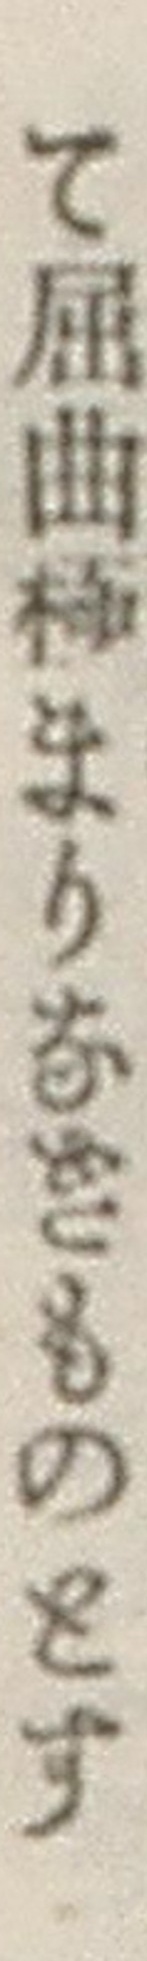て屈曲極まりなきものとす
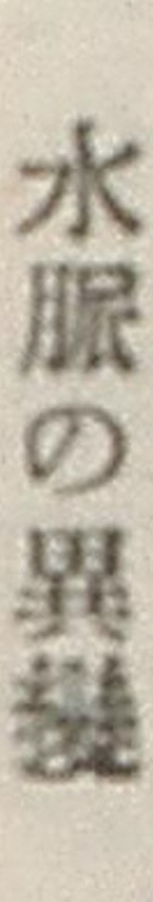水脈の異変
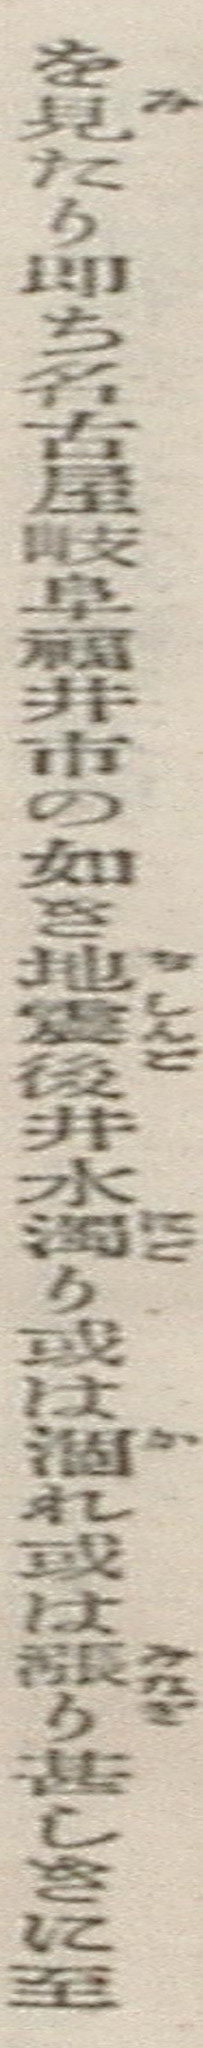を見たり即ち名古屋岐阜福井市の如き地震後井水濁り或は涸れ或は漲り甚しきに至
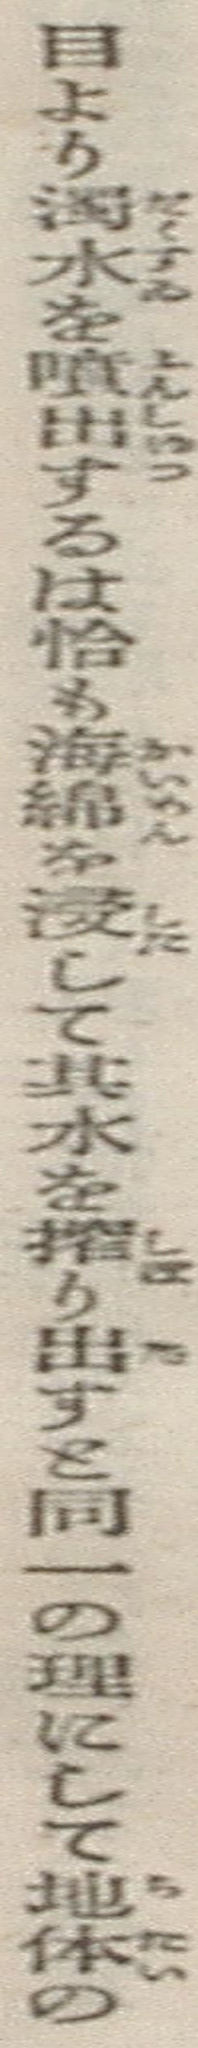目より濁水を噴出するは恰も海綿を浸して其水を搾り出すと同一の理にして地体の
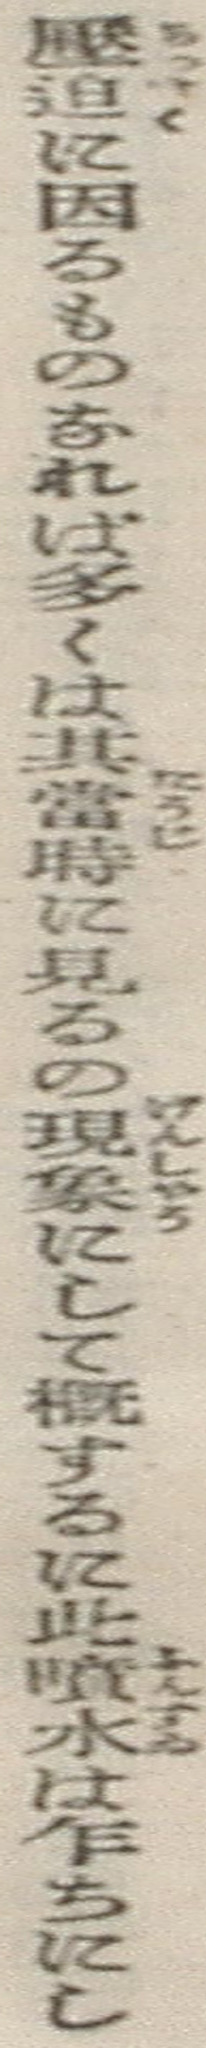圧迫に因るものなれば多くは其当時に見るの現象にして概するに此噴水は乍ちにし
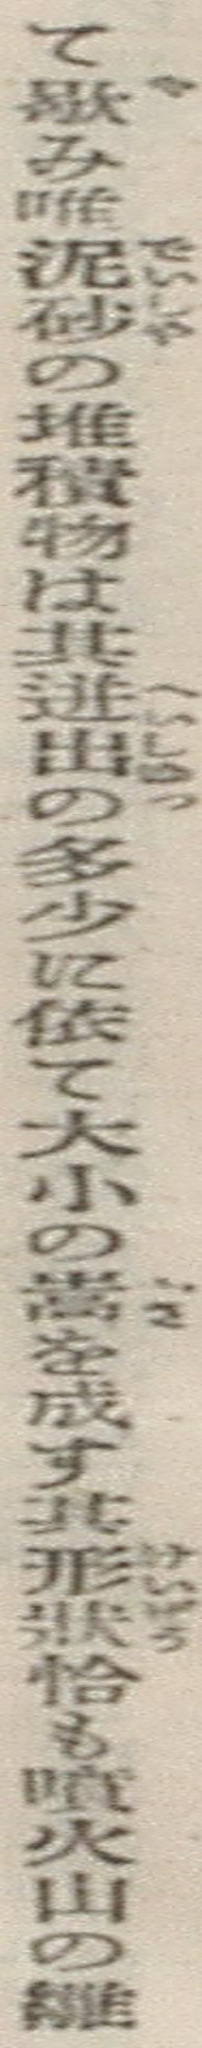て歇み唯泥砂の堆積物は其迸出の多少に依て大小の嵩を成す其形状恰も噴火山の雛
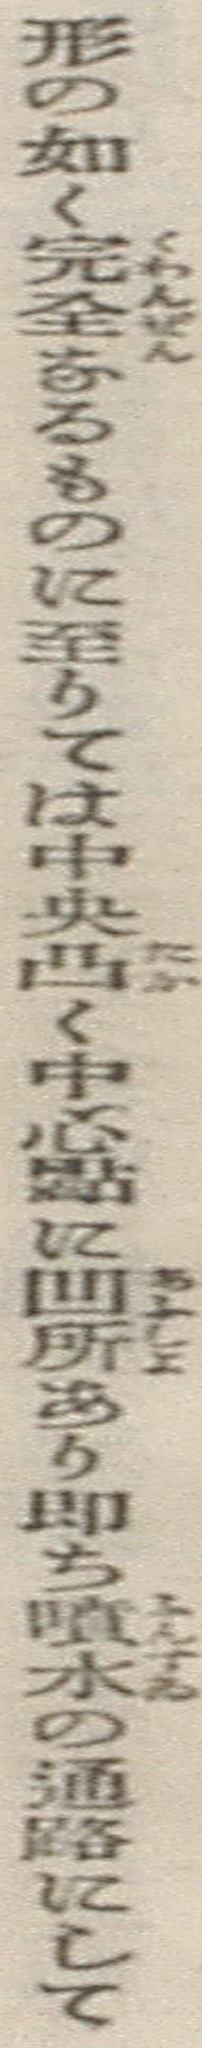形の如く完全なるものに至りては中央凸く中心点に凹所あり即ち噴水の通路にして
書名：愛知岐阜福井三県　大地震見聞録（内題）
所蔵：東京大学地震研究所図書室 Earthquake Research Institute Library, The University of Tokyo, JAPAN
